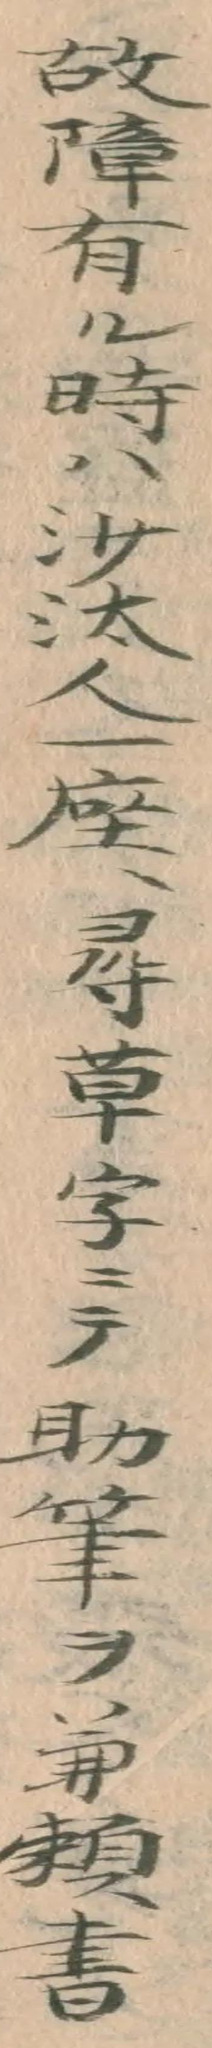故障有ル時ハ沙汰人一座ヘ尋草字ニテ助筆ヲ兼頼書
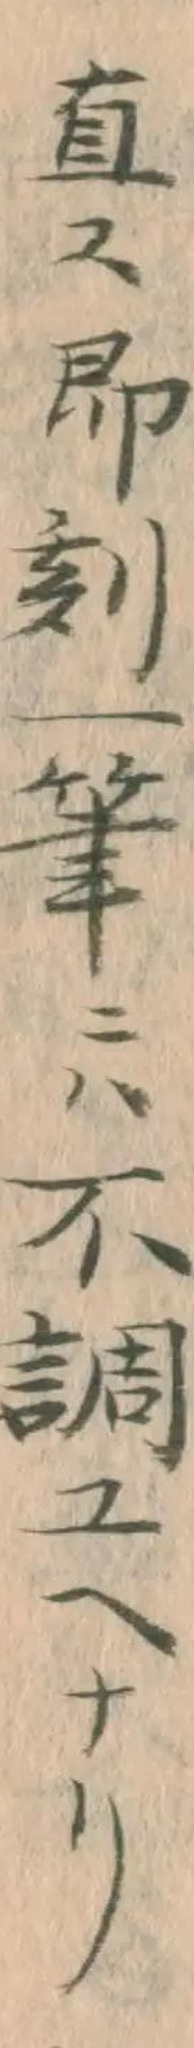直ス即刻一筆ニハ不調ユヘナリ
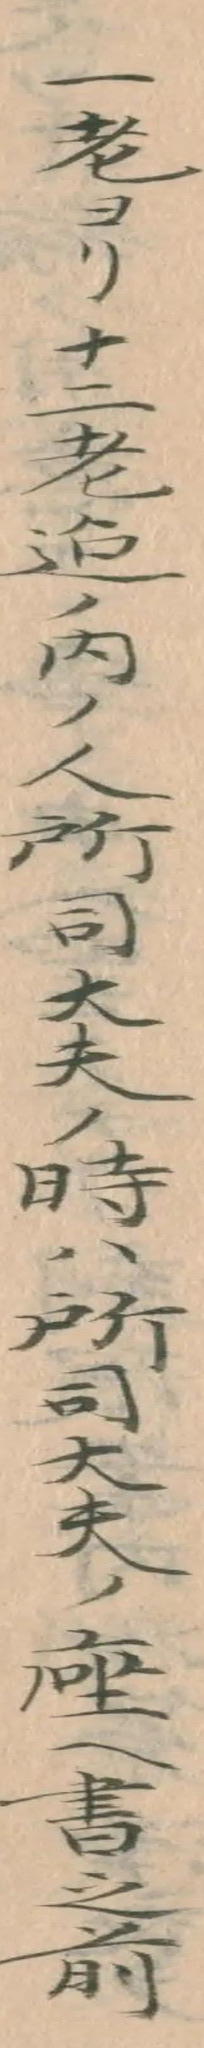一一老ヨリ十二老迄ノ内ノ人所司太夫ノ時ハ所司大夫ノ座ヘ書之前
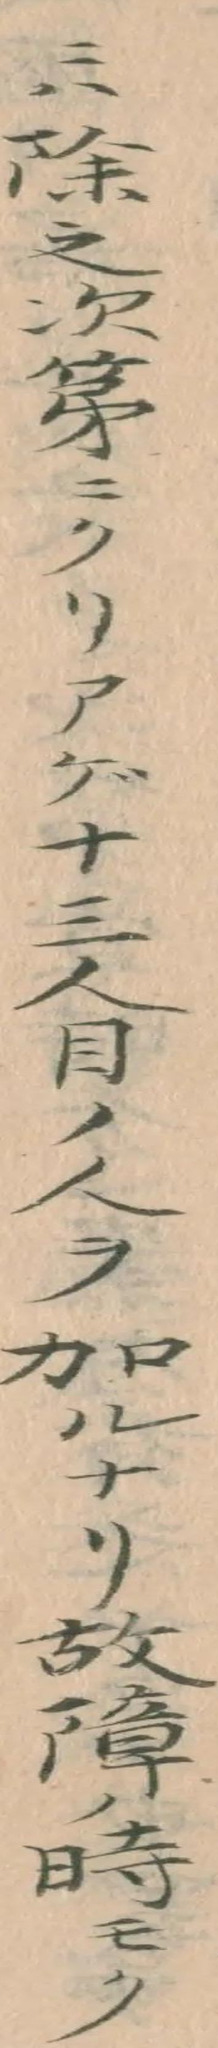ニハ除之次第ニクリアケ十三人目ノ人ヲ加ルナリ故障ノ時モク
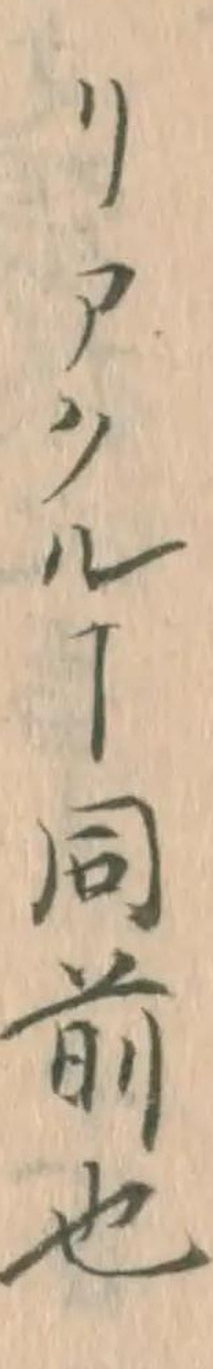リアクルヿ同前也
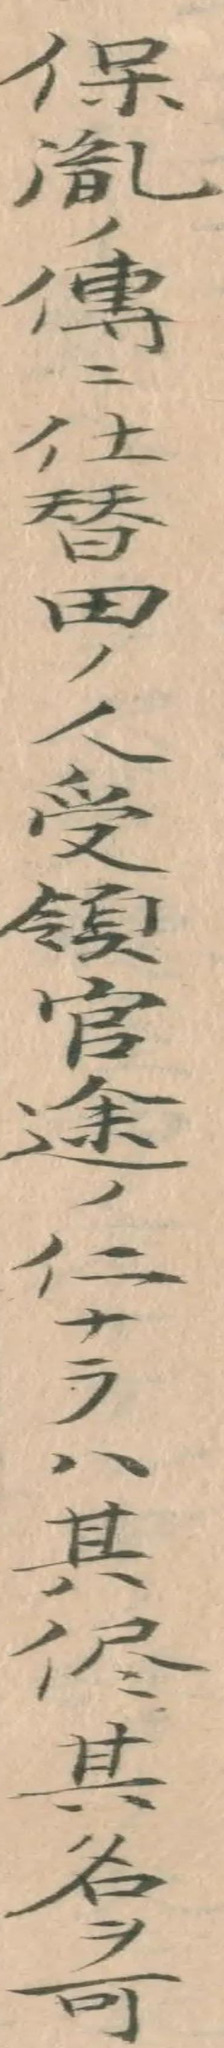一保胤ノ傳ニ仕替田ノ人受領官途ノ仁ナラハ其侭其名ヲ可
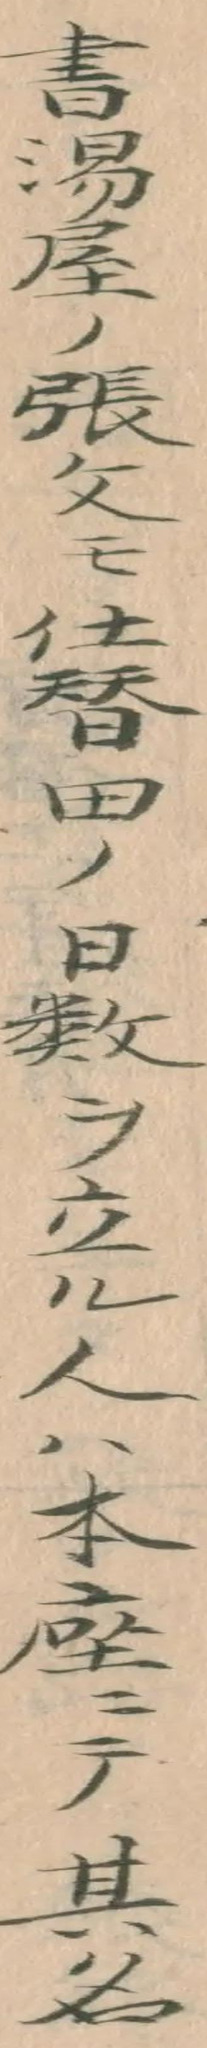書湯屋ノ張文モ仕替田ノ日数ヲ立ル人ハ本座ニテ其名
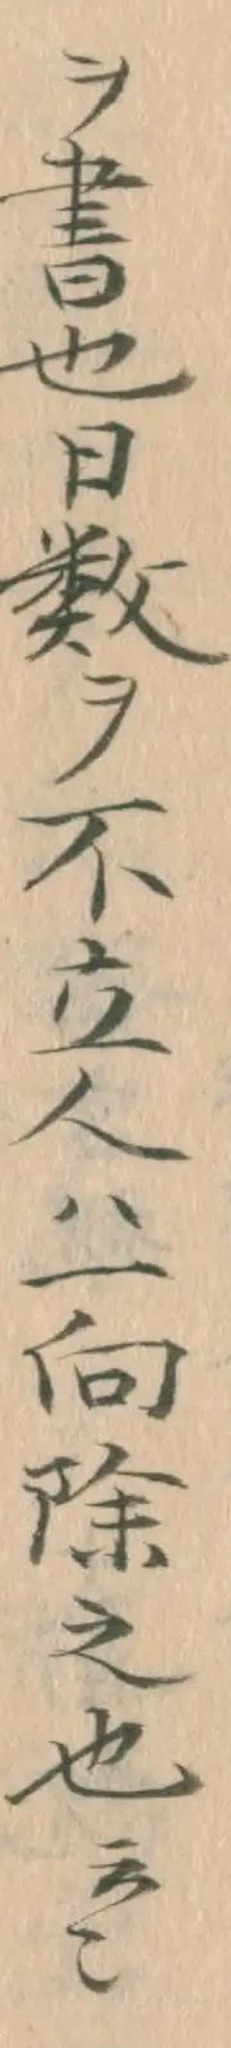ヲ書也日数ヲ不立人ハ一向除之也云〻
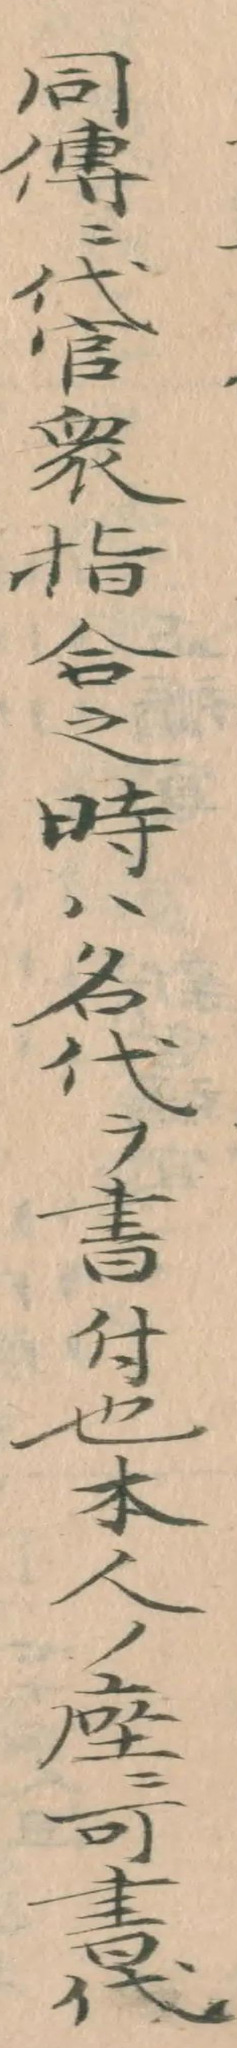一同傳ニ代官衆指合之時ハ名代ヲ書付也本人ノ座ニ可書代
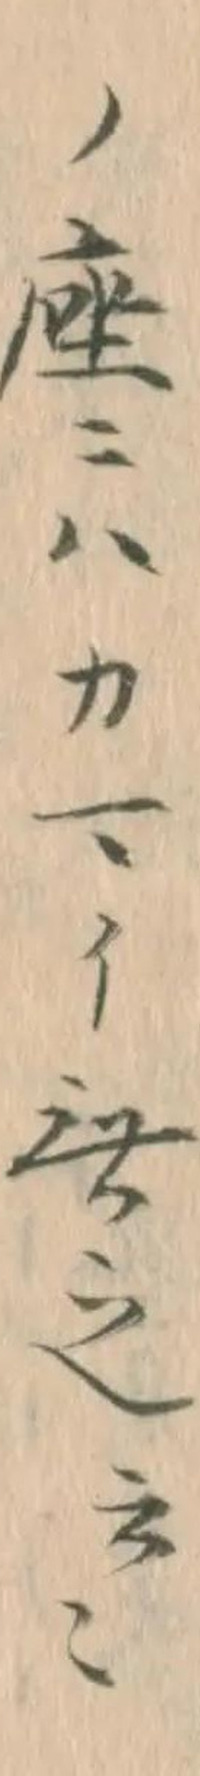ノ座ニハカマイ無之云〻

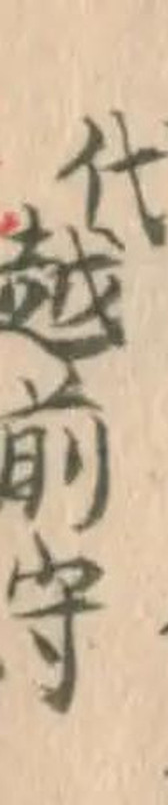代越前守
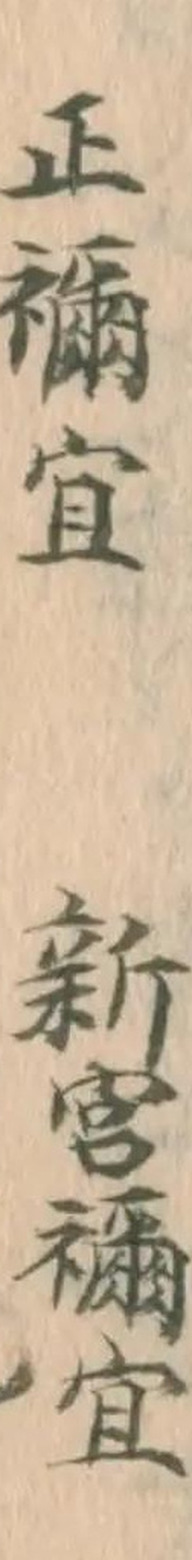正禰宜新宮禰宜
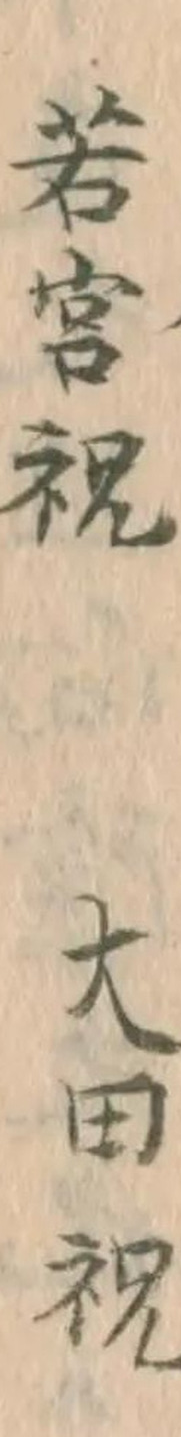若宮祝大田祝
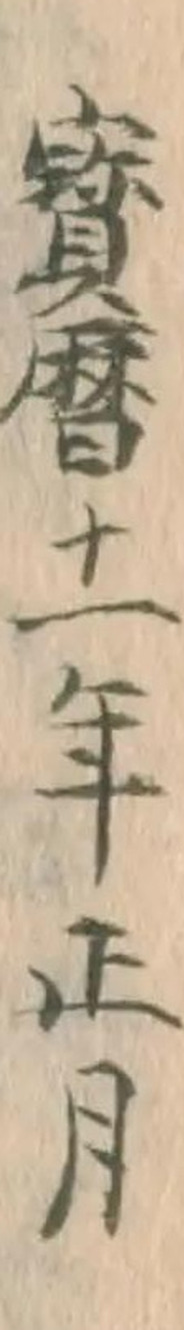寶暦十一年正月
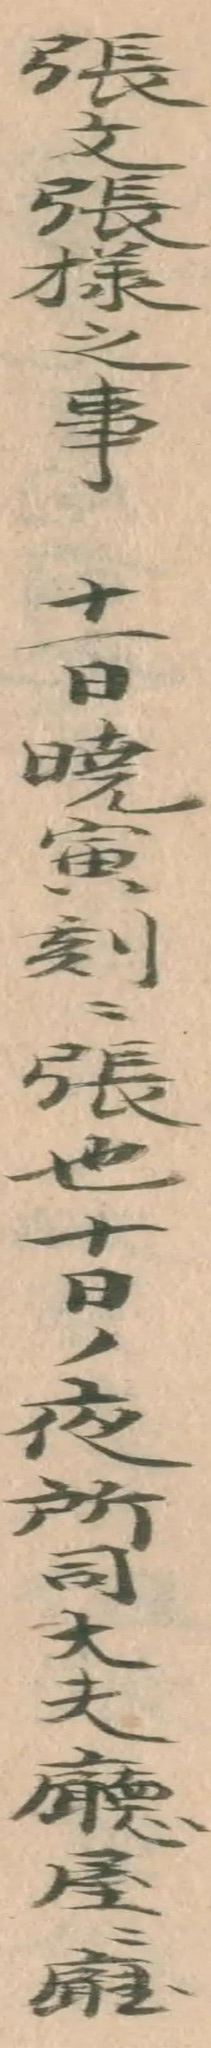一張文張様之事十一日暁寅刻ニ張也十日ノ夜所司大夫廳屋ニ廳
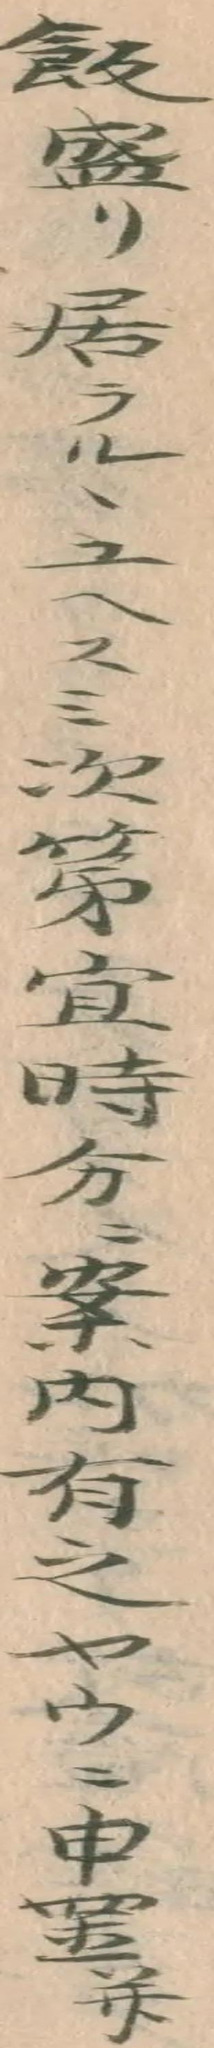飯盛リ居ラルヽユヘスミ次第宜時分ニ案内有之ヤウニ申置并
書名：賀茂社記録. 第40冊
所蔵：国立国会図書館 National Diet Library, JAPAN
